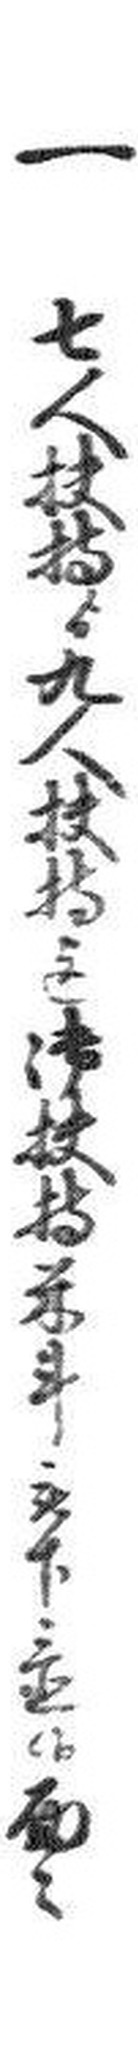一七人扶持ゟ九人扶持迄御扶持米斗被下置候面々

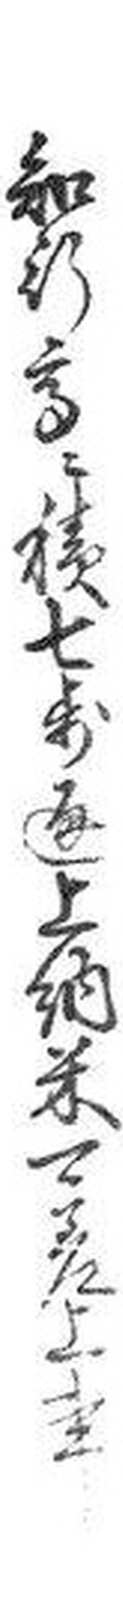知行高ニ積七歩通上納米可差上事
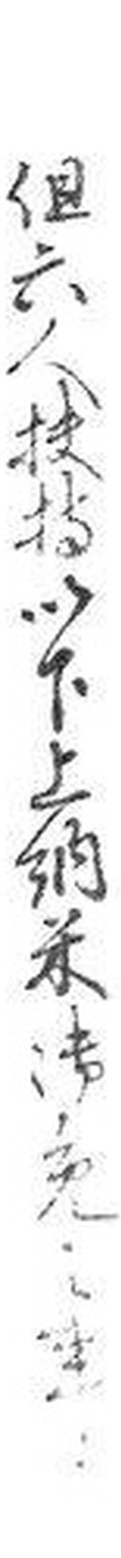但六人扶持以下上納米御免之事
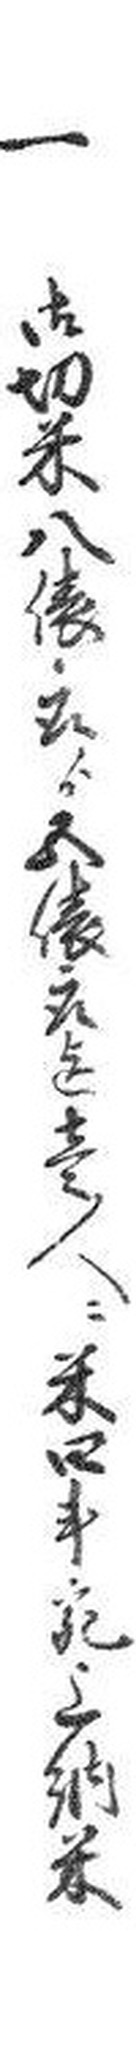一御切米八俵取ゟ五俵取迄壱人ニ米四斗宛上納米
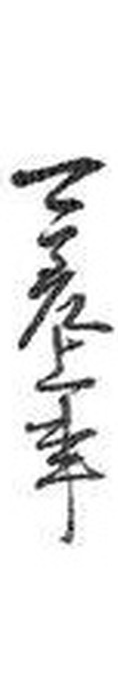可差上事
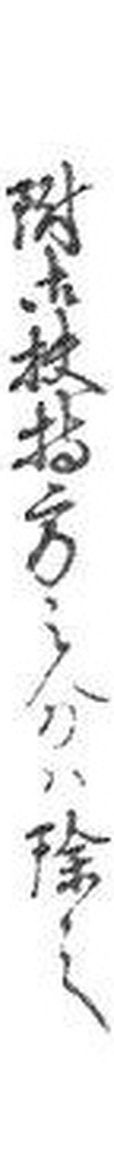附御扶持方之分ハ除之
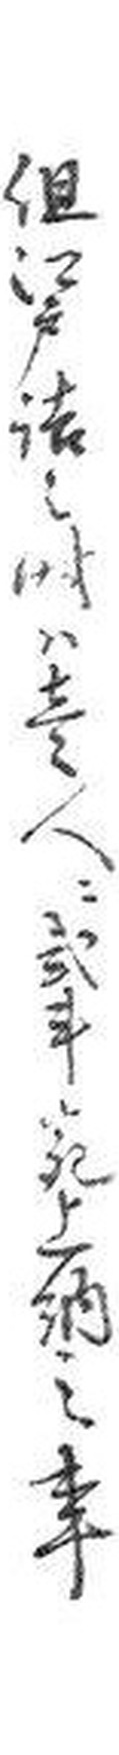但江戸詰之時ハ壱人ニ弐斗宛上納之事
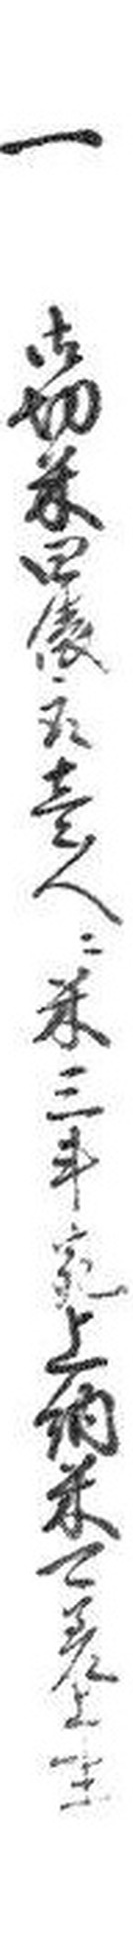一御切米四俵取壱人ニ米三斗宛上納米可差上事
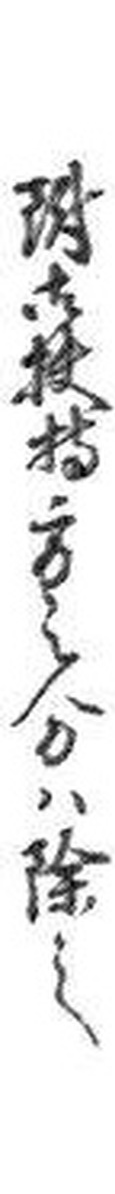附御扶持方之分ハ除之
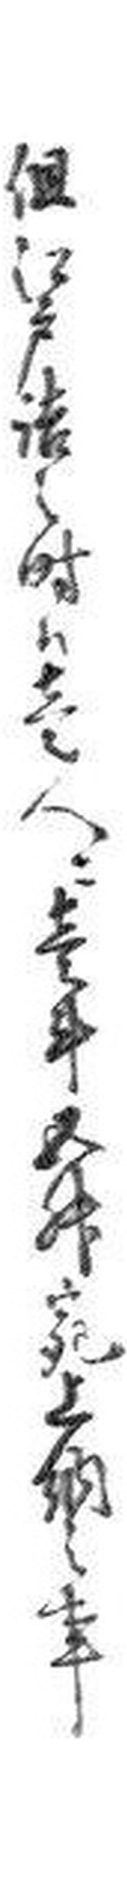但江戸詰之時ハ壱人ニ壱斗五升宛上納之事
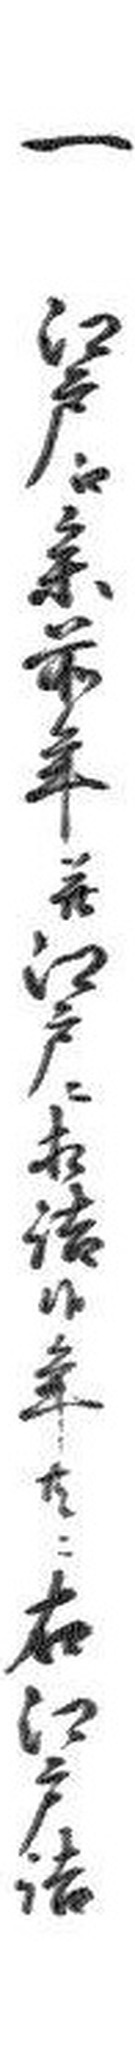一江戸江参前年并江戸ニ相詰候年共ニ右江戸詰
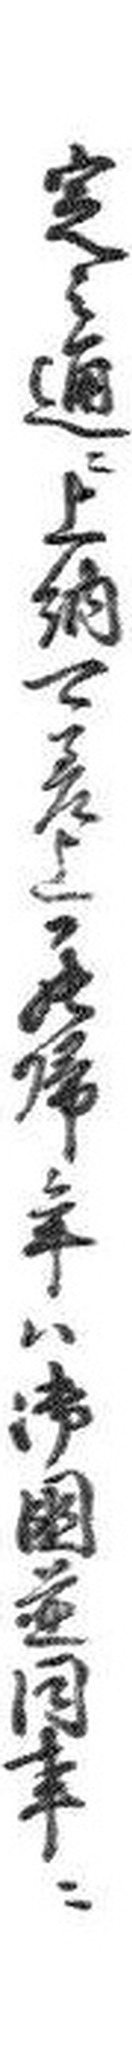定之通ニ上納可差上罷帰年ハ御国並同事ニ
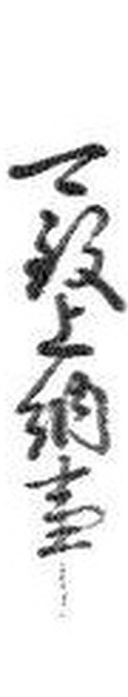可致上納事
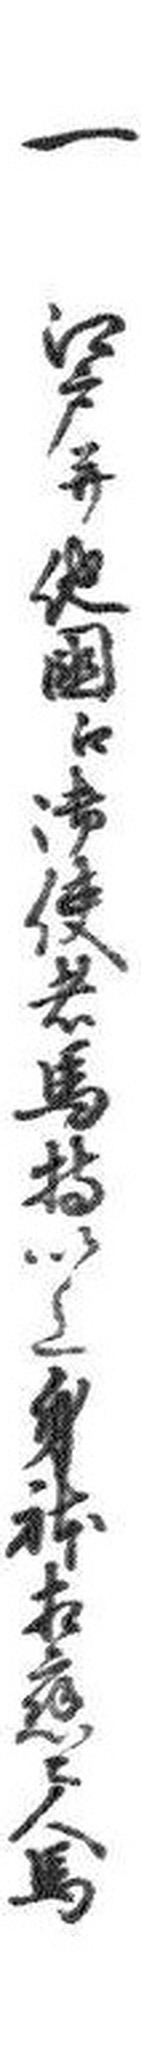一江戸并他国江御使者馬持以上身体相応ニ人馬
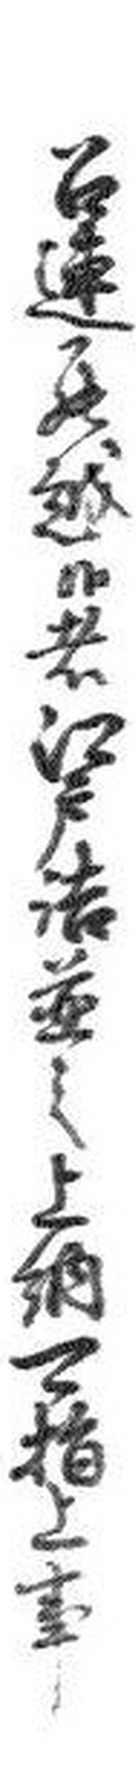召連罷越候者江戸詰並之上納可指上事
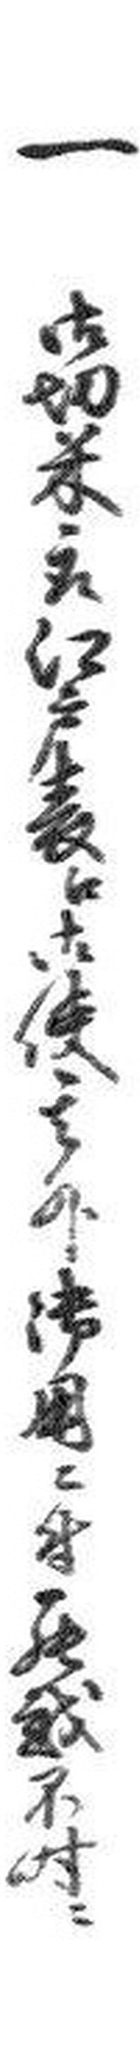一御切米取江戸表江御使其外御用ニ付罷越不時ニ
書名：家譜 二十三 吉品公 従宝永元年到同二年
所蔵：福井県文書館 Fukui Prefectural Archives
